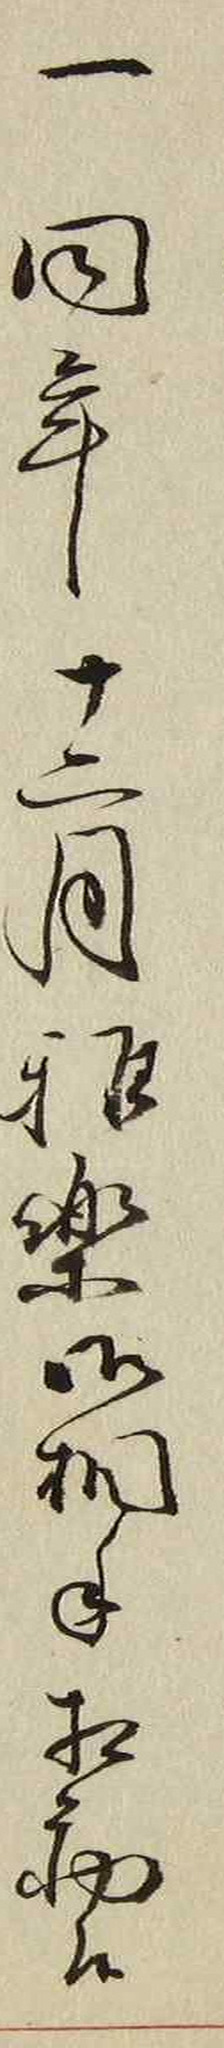一同年十二月雅楽御相手相勤候
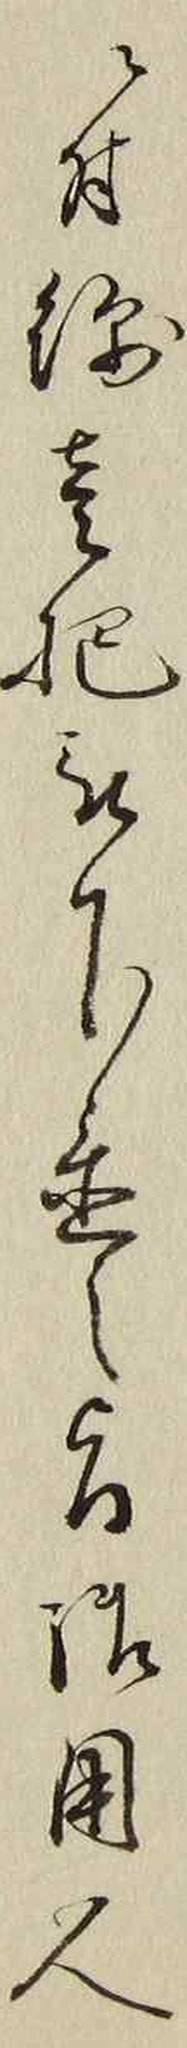に付綿壱把被下置の旨御用人
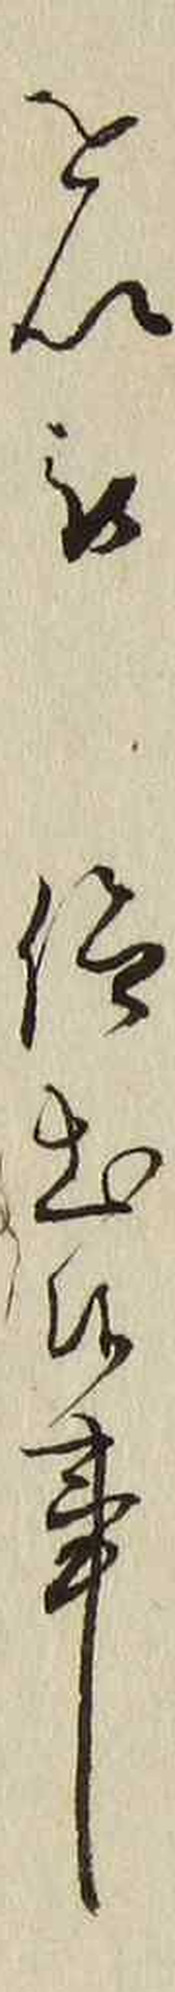を以被仰出候事
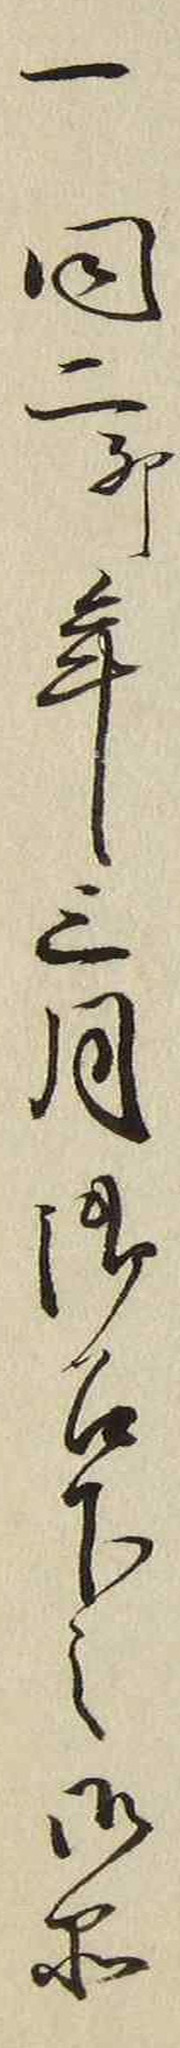一同二卯年三月御召下の御品

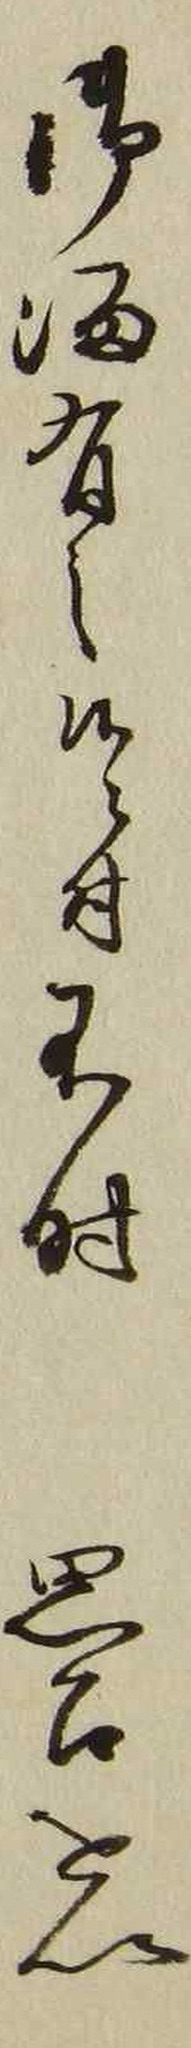御酒有之候に付不時思召を以
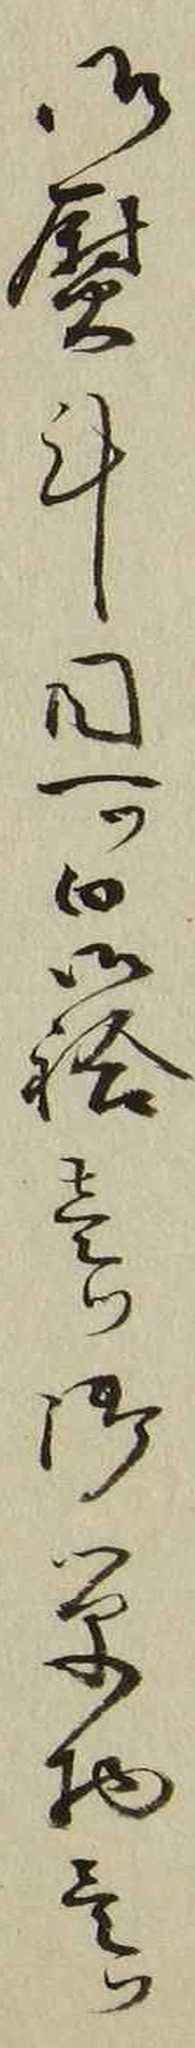御熨斗目一ツ白御袷壱ツ御単物壱ツ
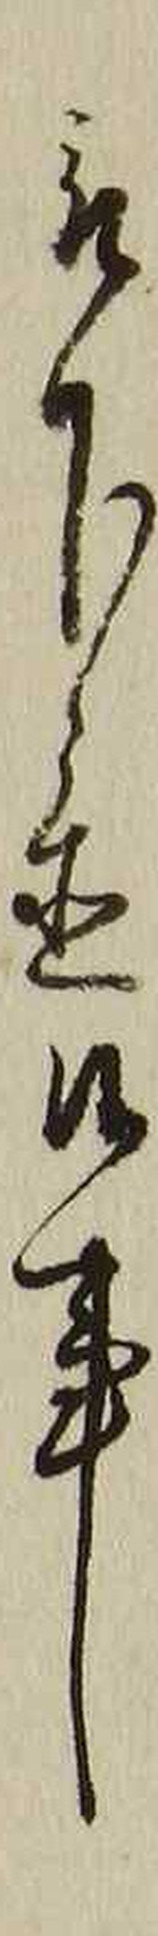被下置候事
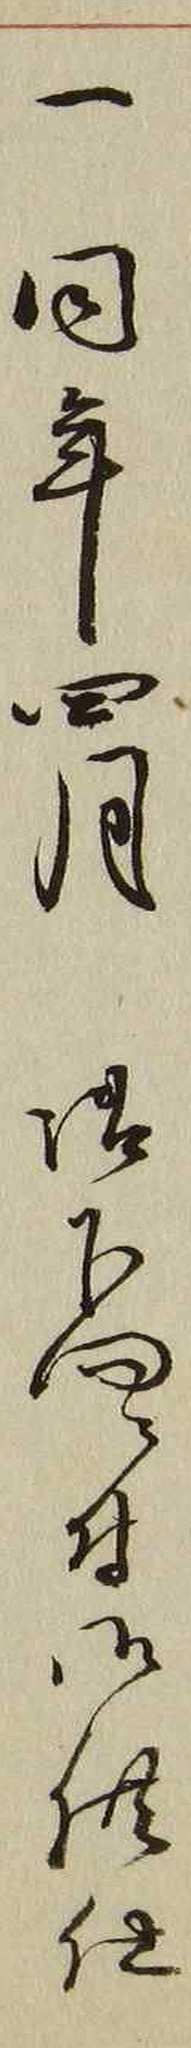一同年四月御下向に付御供仕
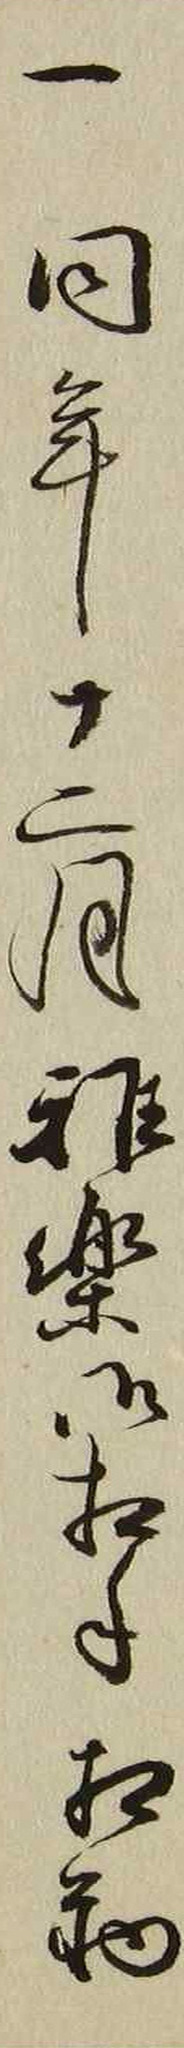一同年十二月雅楽御相手相勤
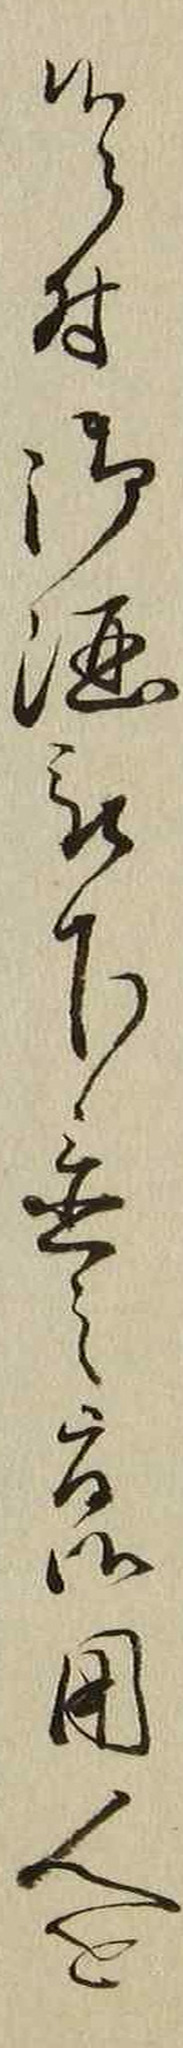候に付御酒被下置の旨御用人を
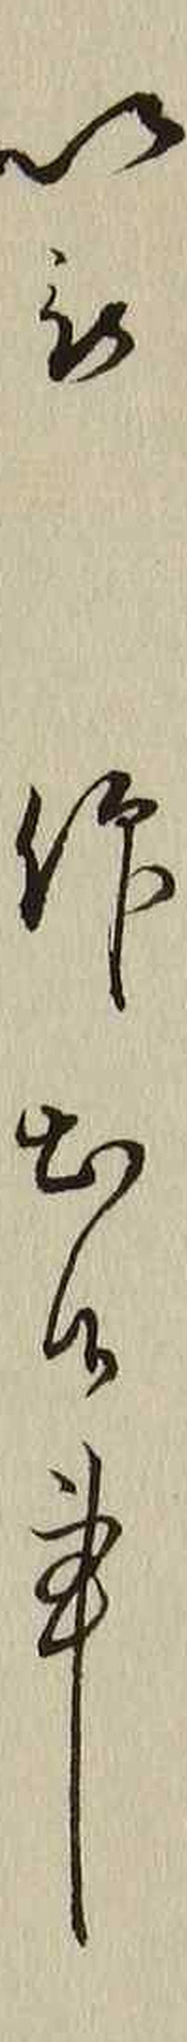以被仰出候事
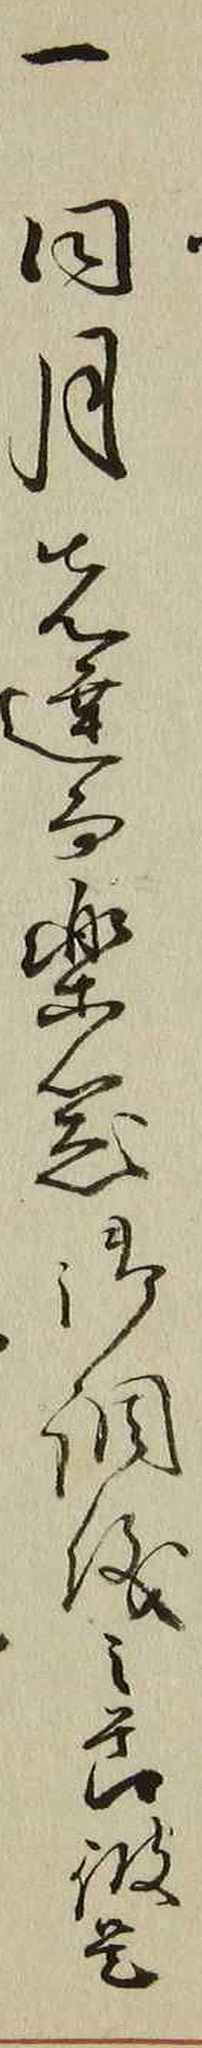一同月先達而楽器御調儀の節彼是
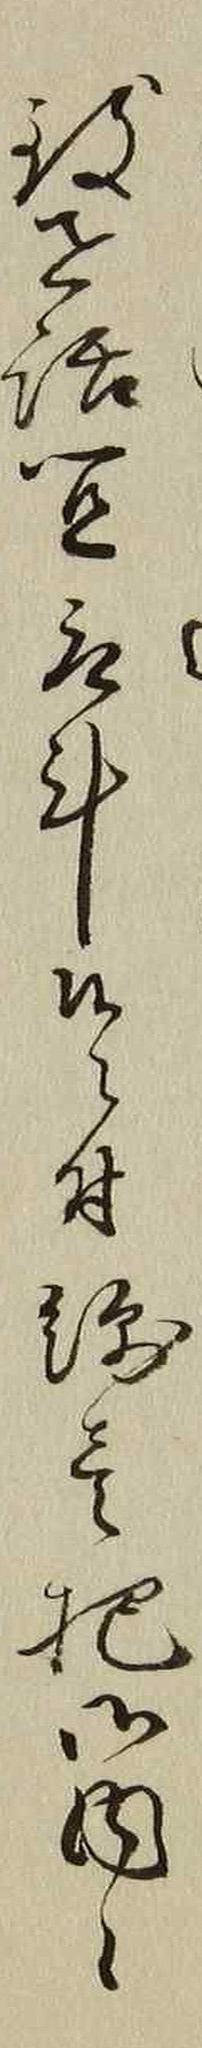致世話宜取計候に付綿壱把御内々
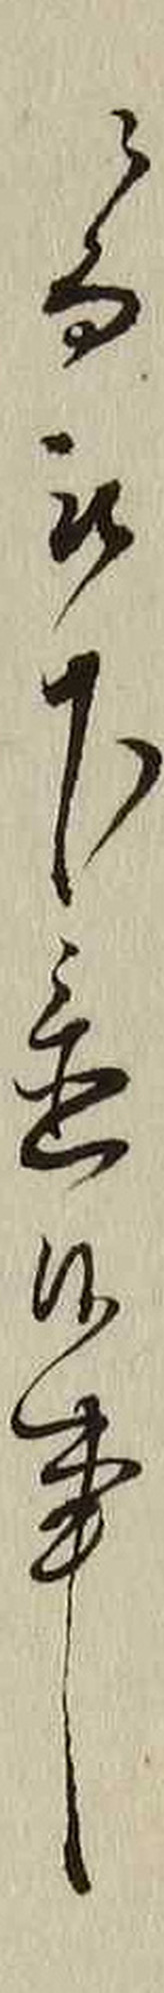に而被下置候事
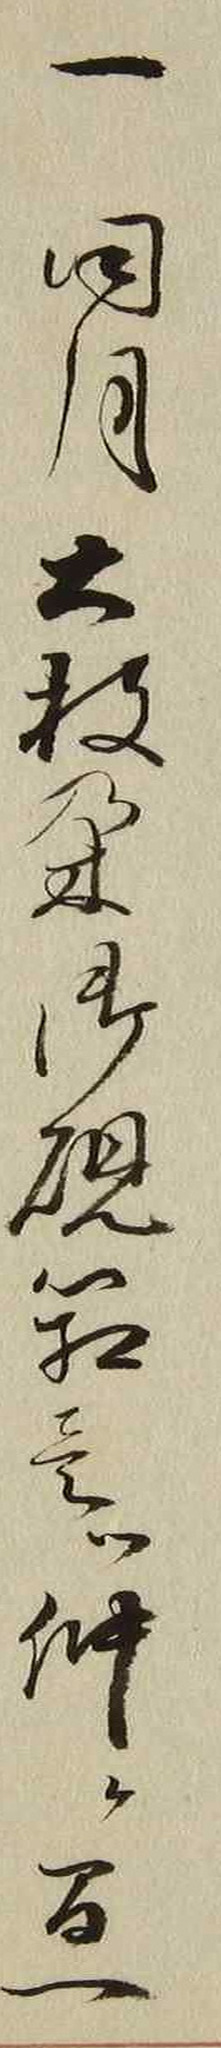一同月大枝朶御硯箱壱ツ仲ケ間一
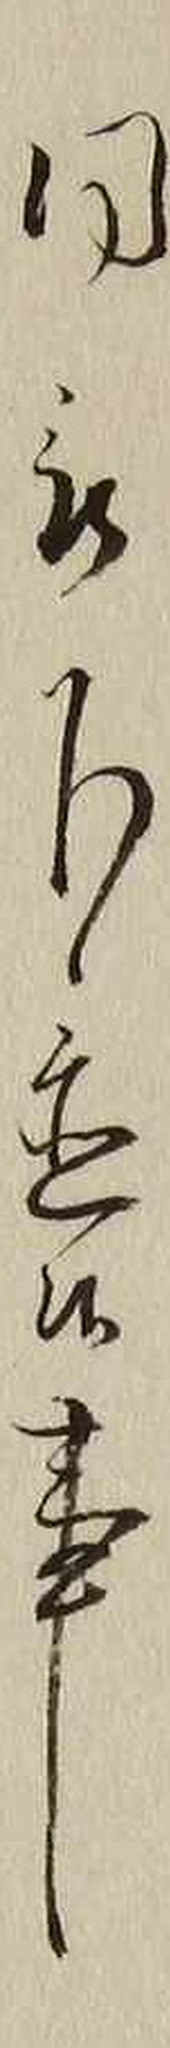同被下置候事
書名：諸士系譜　巻之1　い之部1
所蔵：会津若松市立会津図書館
